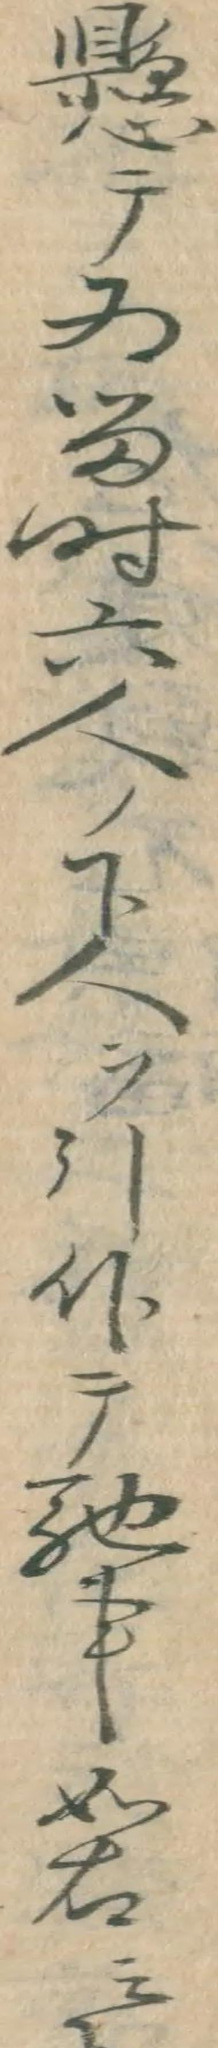懸テ為留時六人ノ下人ヲ引仆テ馳事如右云々

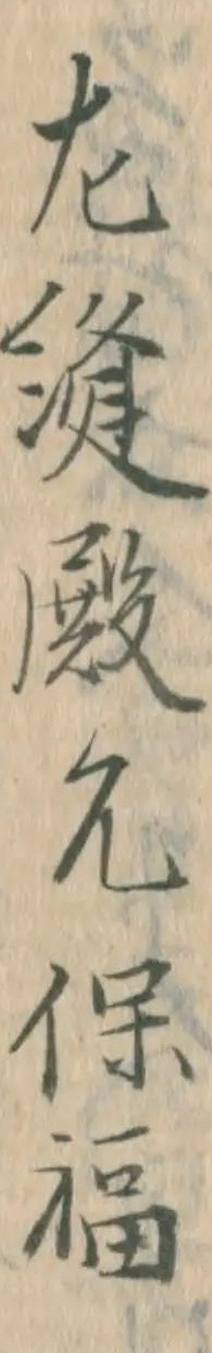左縫殿允保福
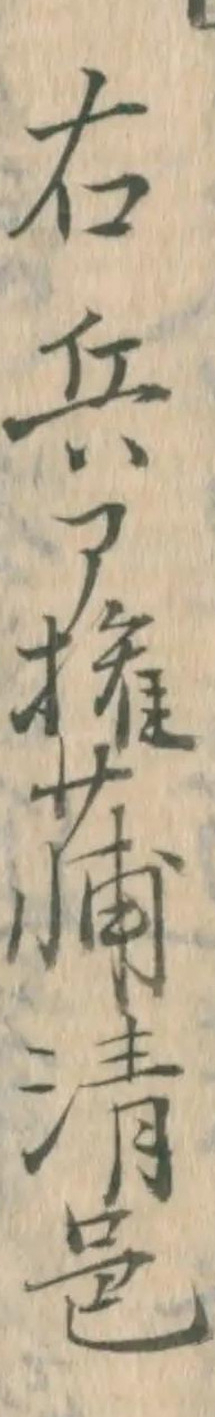右兵部権少輔清邑
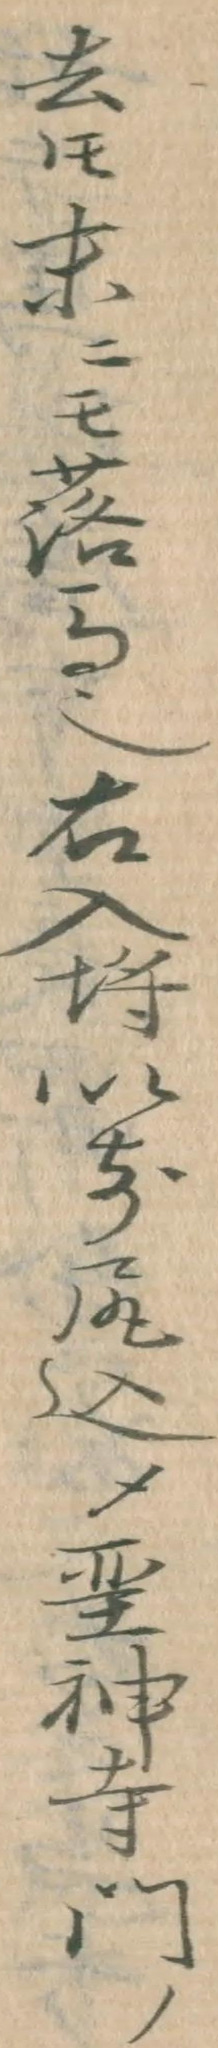去トモ末ニモ落馬也右入埒以前尻込シテ聖神寺門ノ
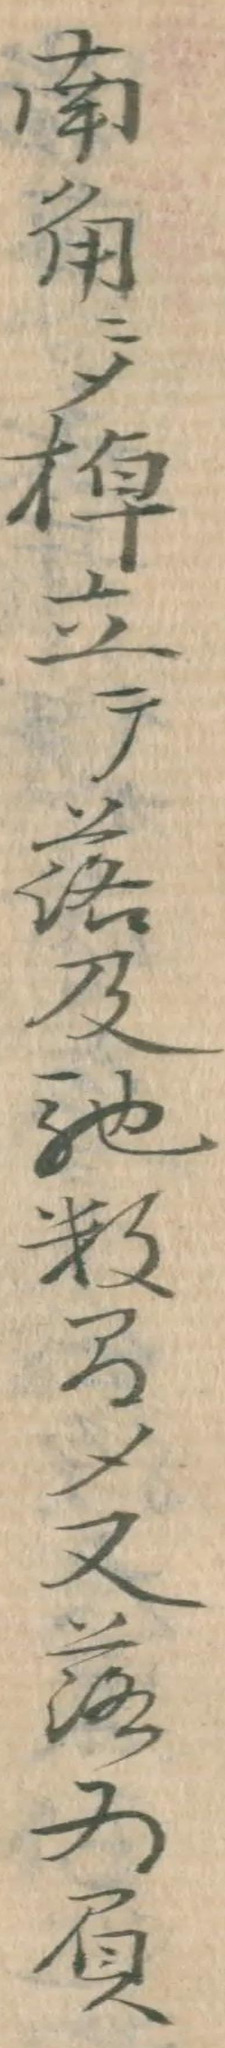南角ニシテ棹立テ落及馳数間シテ又落為負
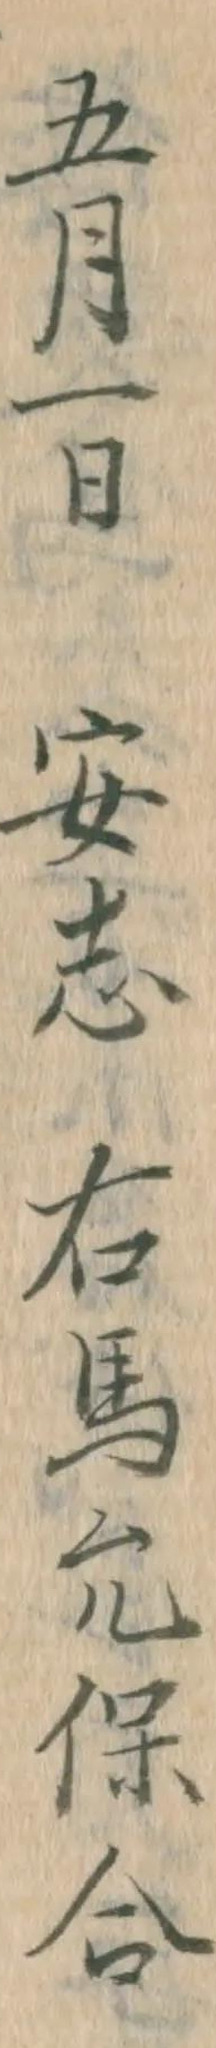五月一日安志右馬允保合
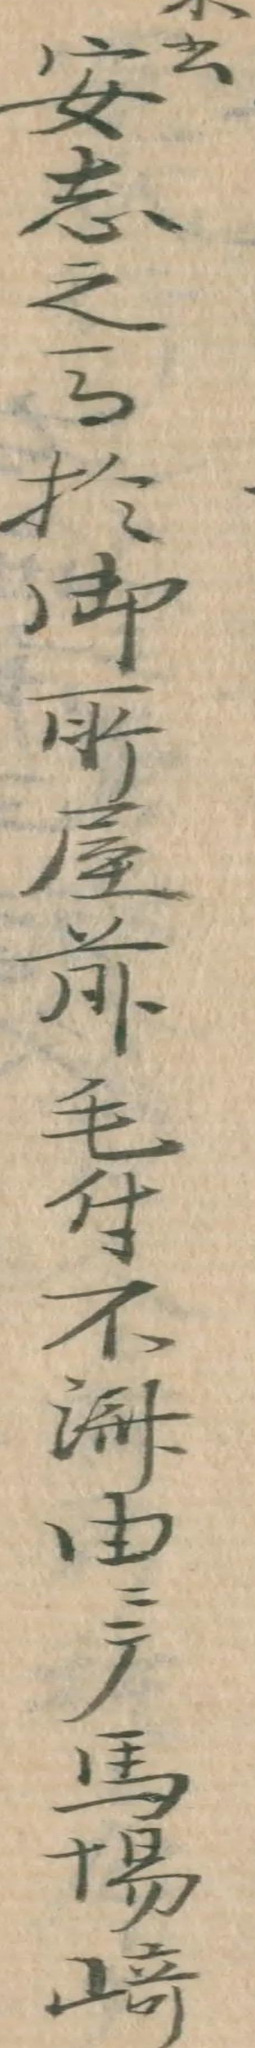安志之馬於御所屋前毛付不済由ニテ馬場崎
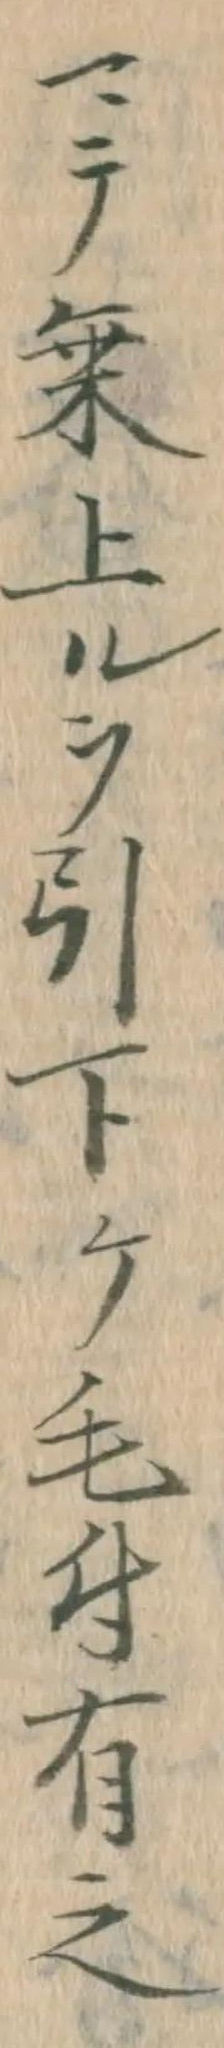マテ乗上ルヲ引下ケ毛付有之
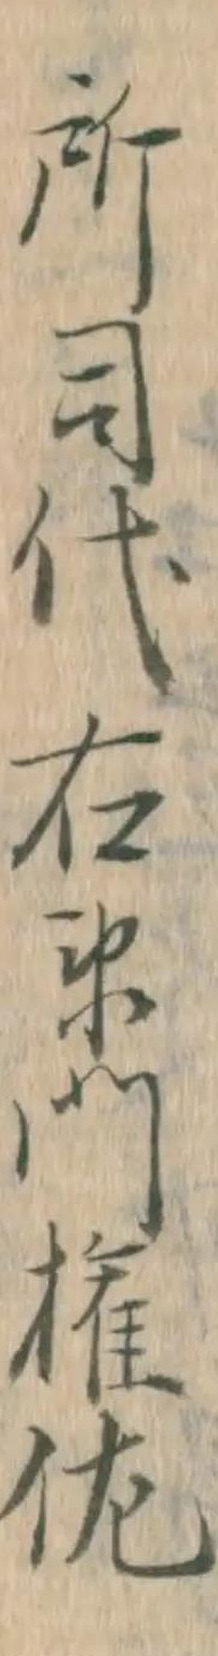所司代右衛門権佐
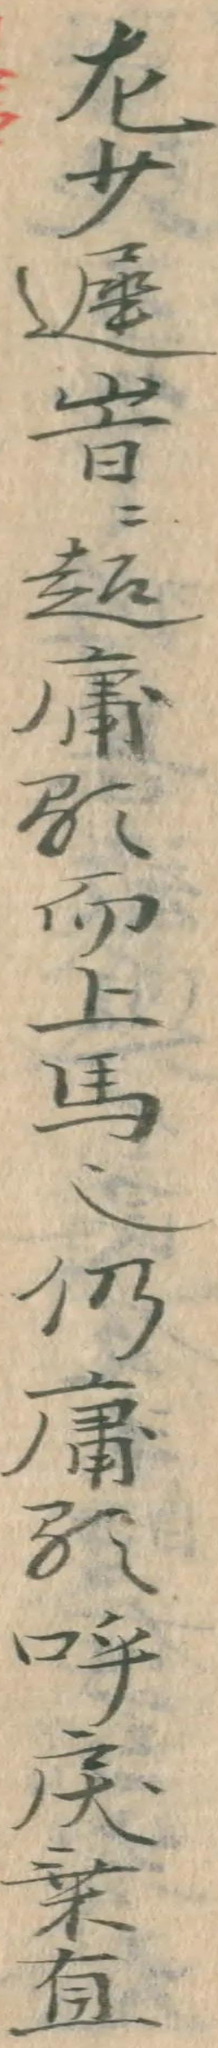左少遅旹ニ趣庸顕而上馬也仍庸顕呼戻乗直
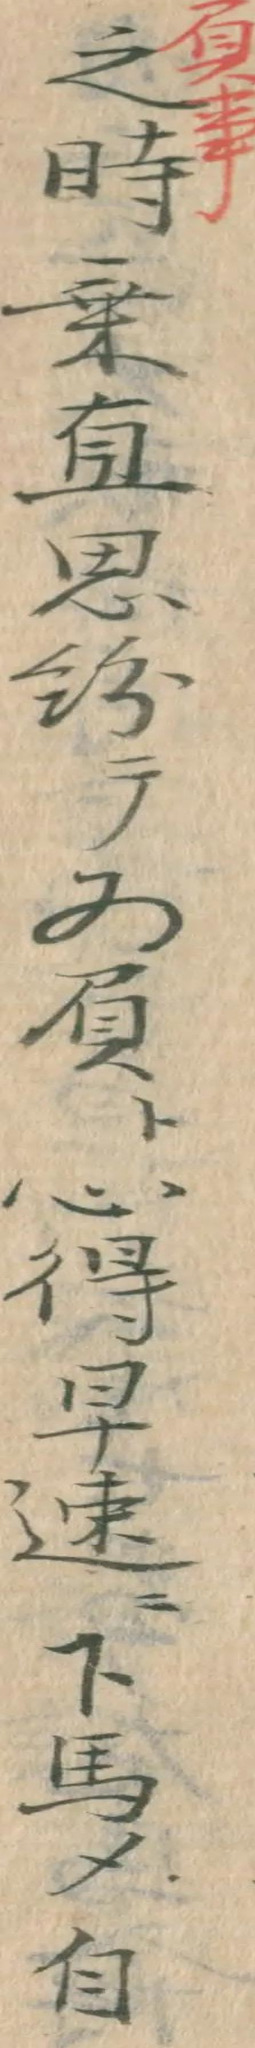之時乗直思紛テ為負ト心得早速ニ下馬シテ自
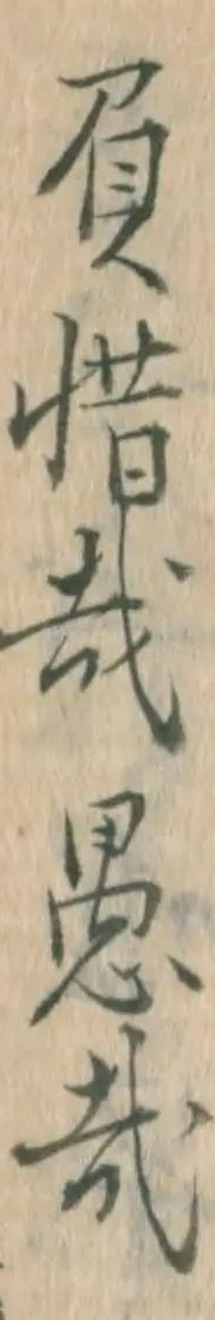負借哉愚哉
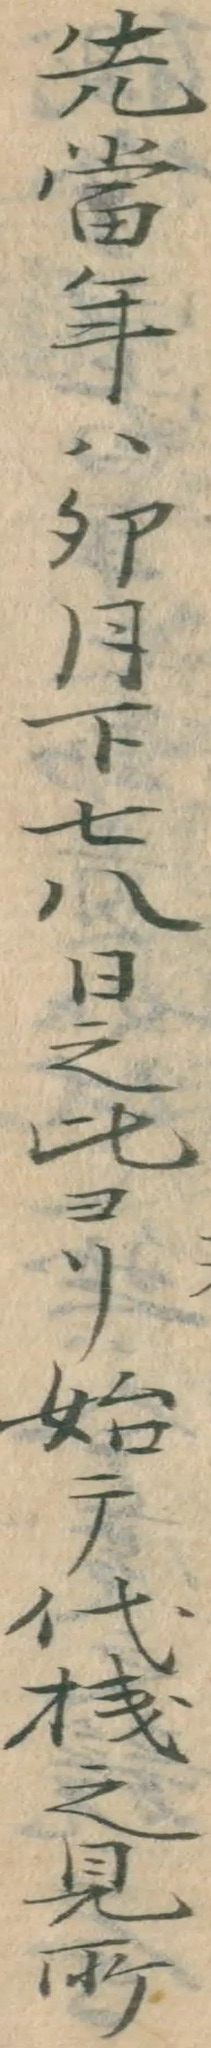先当年ハ卯月下七八日之比ヨリ始テ代桟之見所
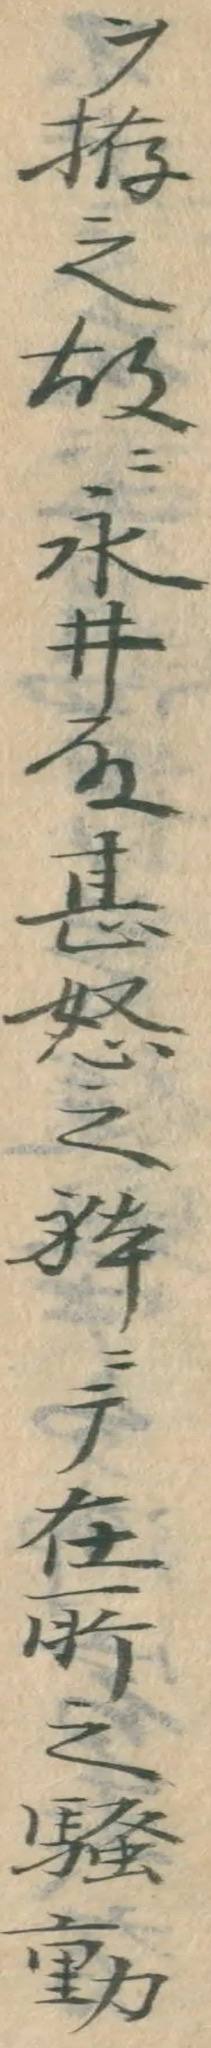ヲ拵之故ニ永井殿甚怒之体ニテ在所之騒動

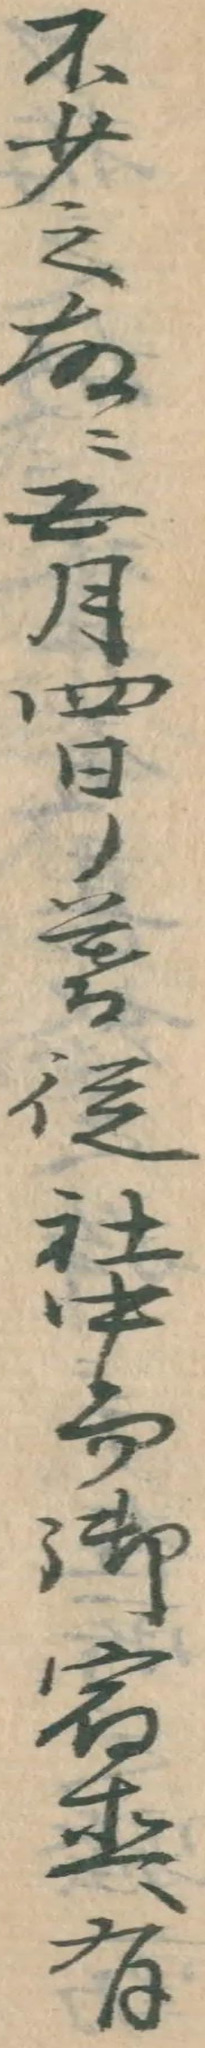不少之故ニ五月四日ノ暮従社中而御宿直へ有
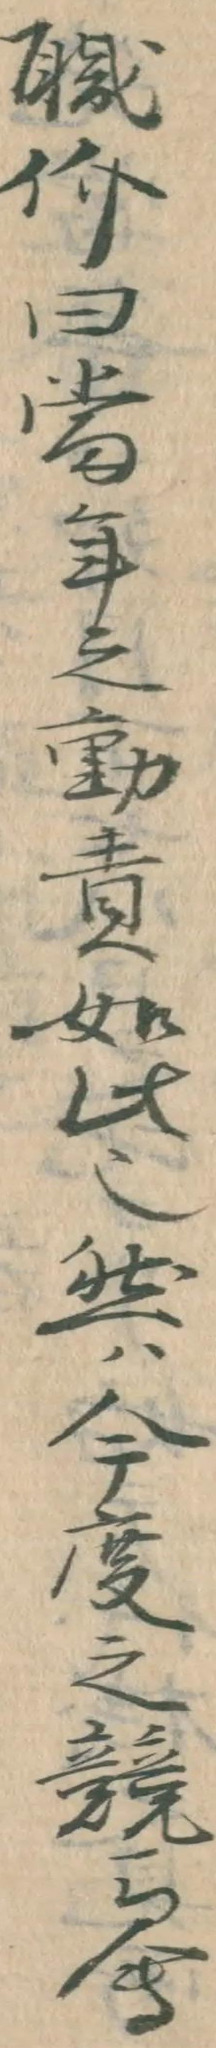職价曰当年之動責如此也然ハ今度之競馬会
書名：賀茂社記録. 第10冊
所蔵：国立国会図書館 National Diet Library, JAPAN
